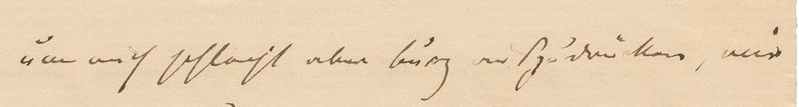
um mich schlecht aber kurz auszudrücken, mir
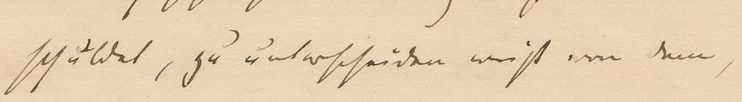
schuldet, zu unterscheiden weiß von dem,
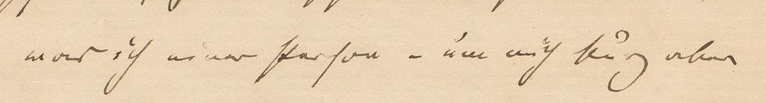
was ich einer Person – um mich kurz aber
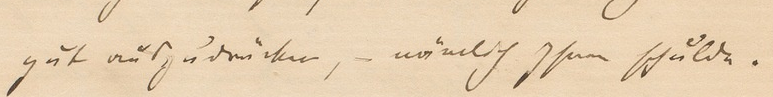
gut auszudrücken, – nämlich Ihnen schulde.
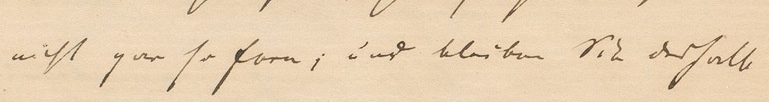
nicht gar so fern; und bleiben Sie deshalb
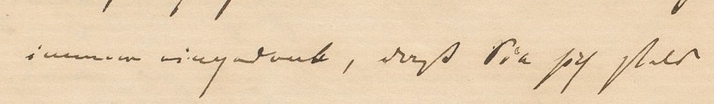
immer eingedenk, daß Sie sich stets
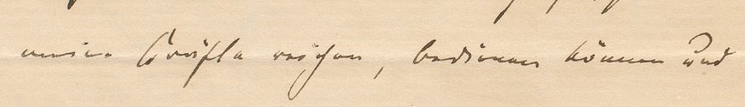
meine Kräfte reichen, bedienen können und
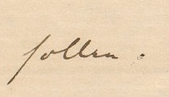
sollen.
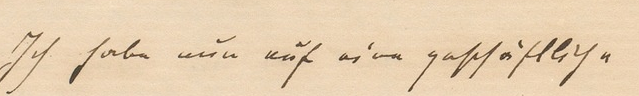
Ich habe nun auf eine geschäftliche
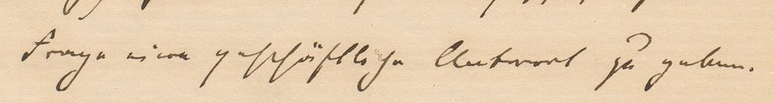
Frage eine geschäftliche Antwort zu geben.
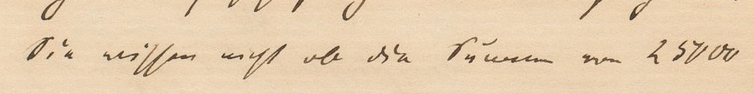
Sie wissen nicht ob die Summe von 25000
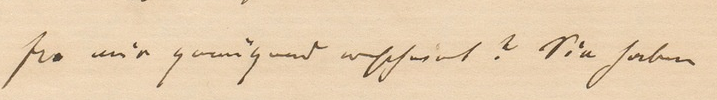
frs mir genügend erscheint? Sie haben
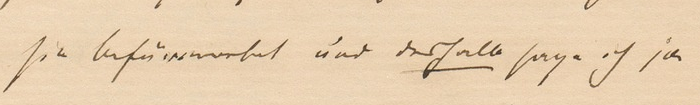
sie befürwortet und deshalb sage ich ja.
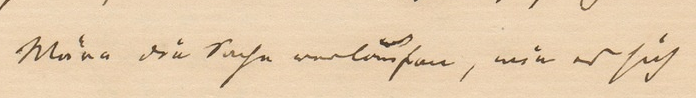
Wäre die Sache verlaufen, wie es sich
